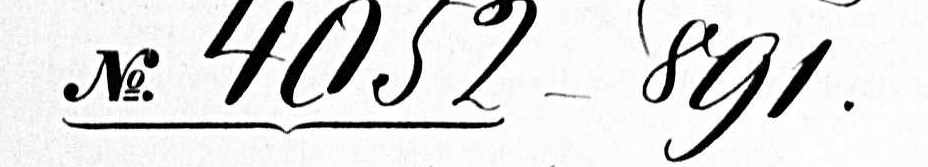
No. 4052 – 1891
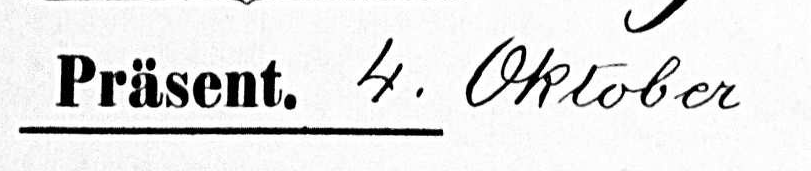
Präsent. 4. Oktober
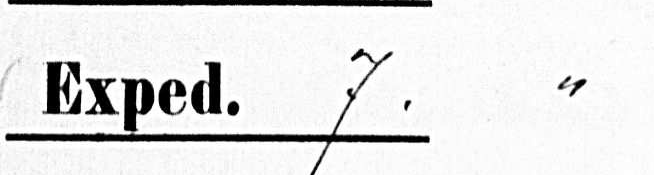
Expedit 7. „
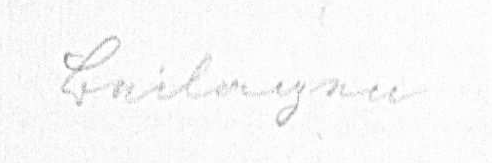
Beilagen
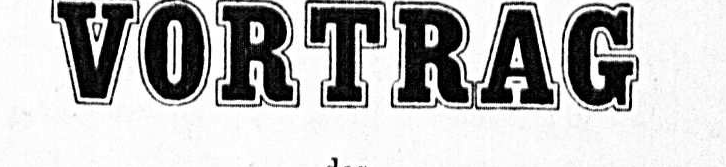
VORTRAG
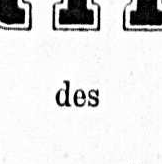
Des
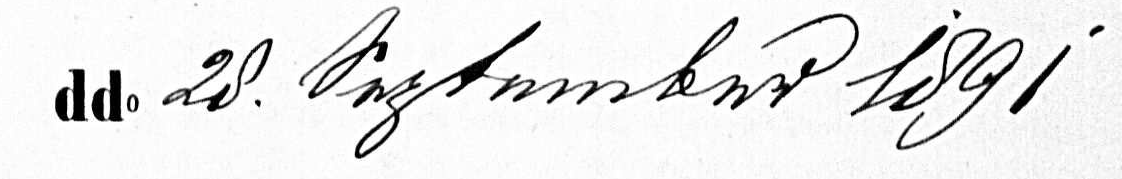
ddo 28 September 1891
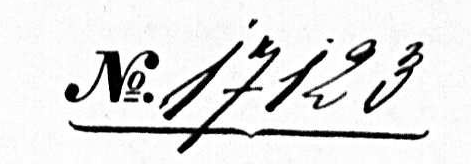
No 17123
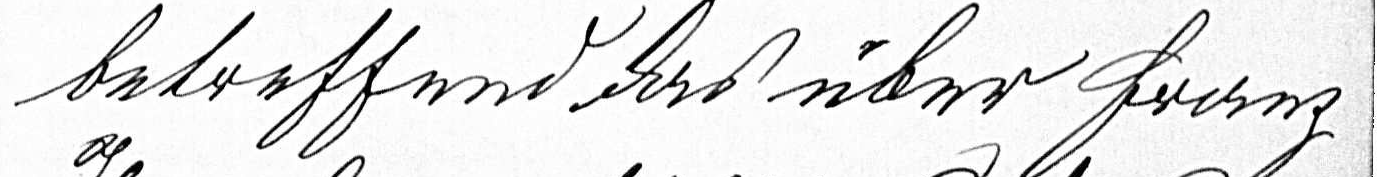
Betreffend des über Franz
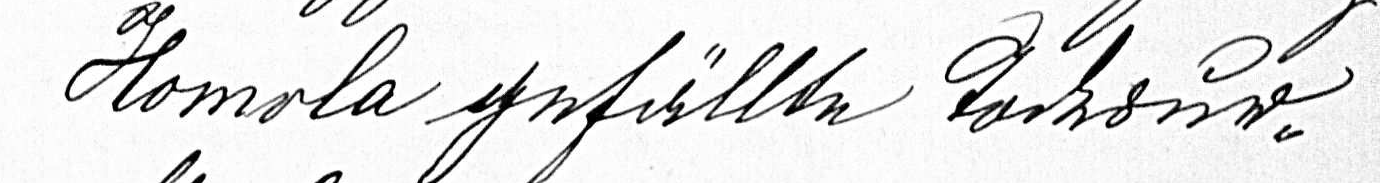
Homola gefällte Todesur¬
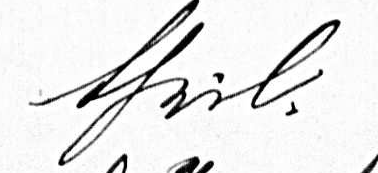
theil.
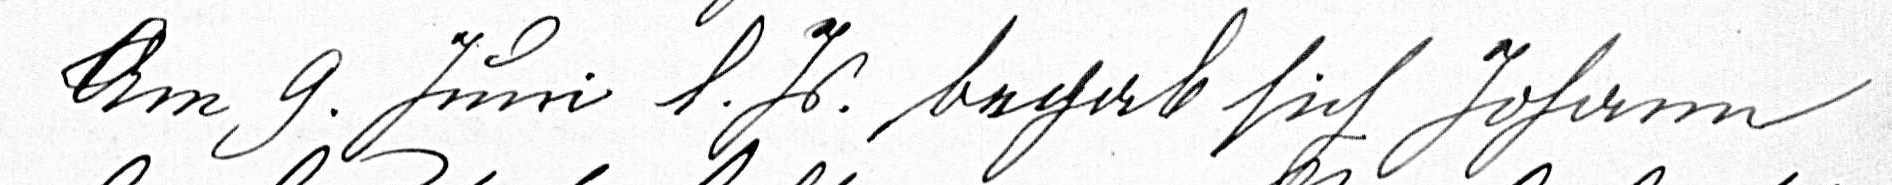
Am 9. Juni l. Js. begab sich Johann
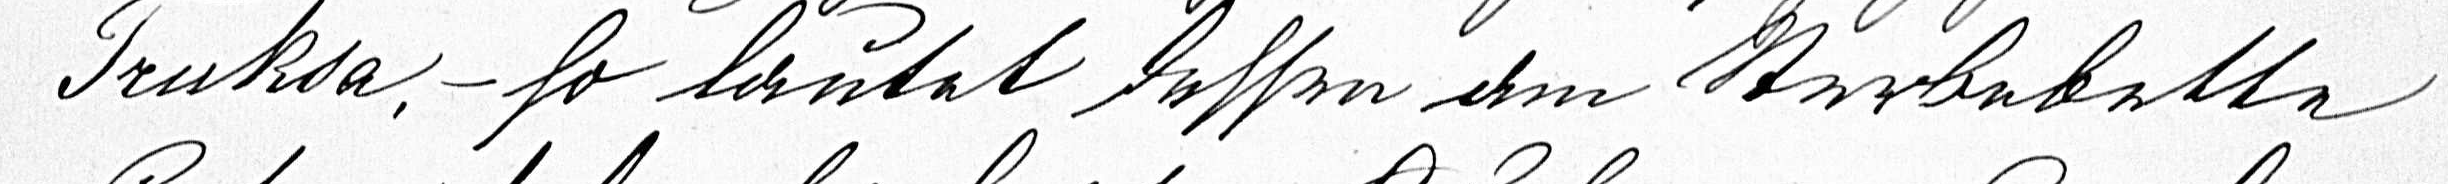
Truksa, – so lautet dessen am Sterbebette
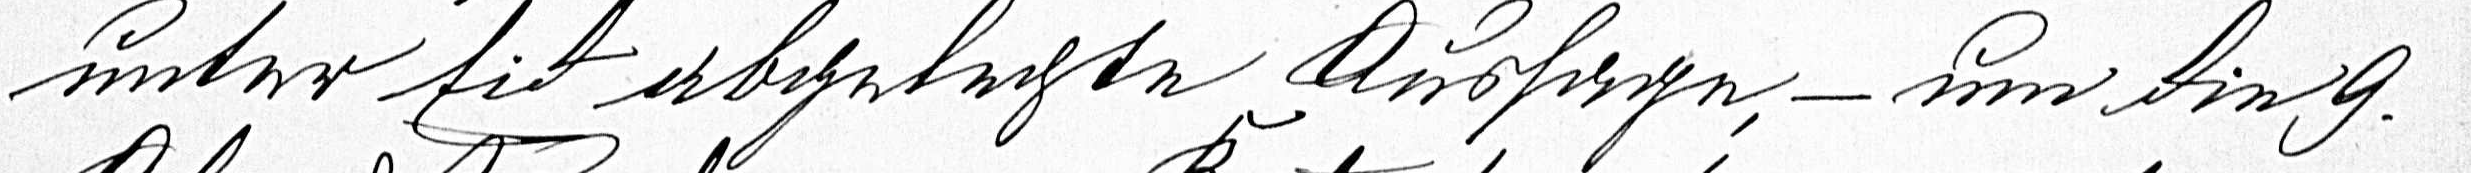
unter Eid abgelegte Aussage, – um die 9.
